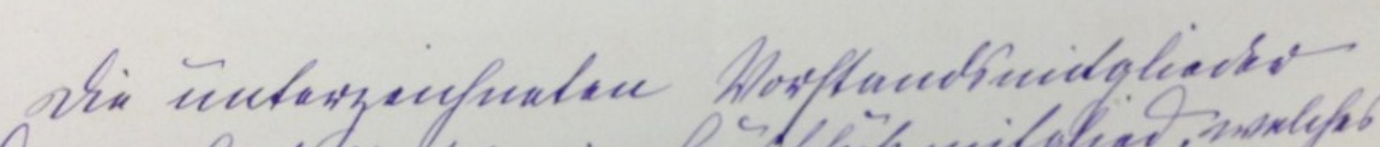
Die unterzeichnenden Vorstandsmitglieder
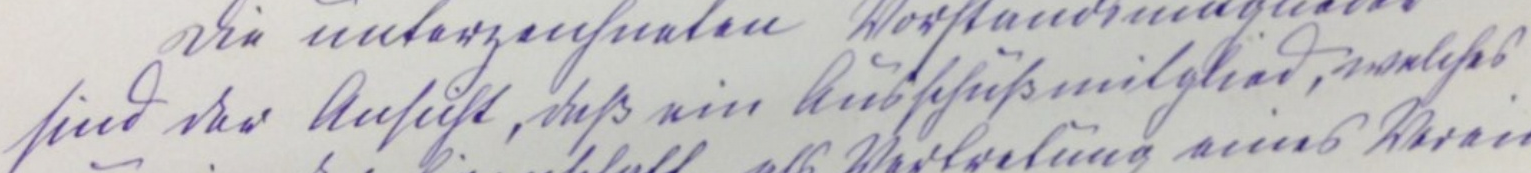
sind der Ansicht, daß ein Ausschußmitglied, welches
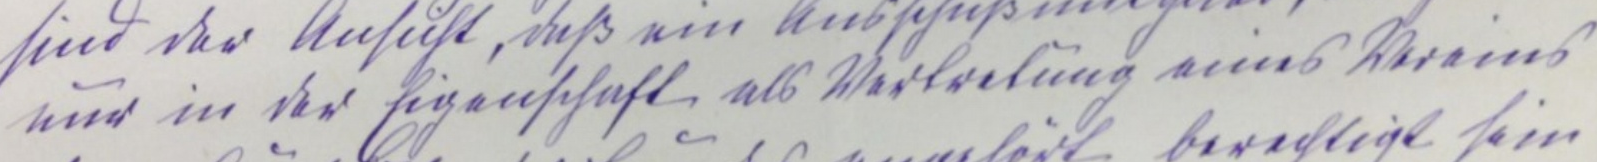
nur in der Eigenschaft als Vertretung eines Vereins
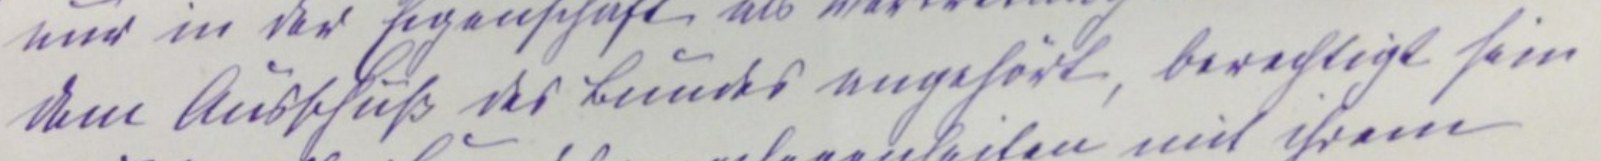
dem Ausschuß des Bundes angehört, berechtigt sein
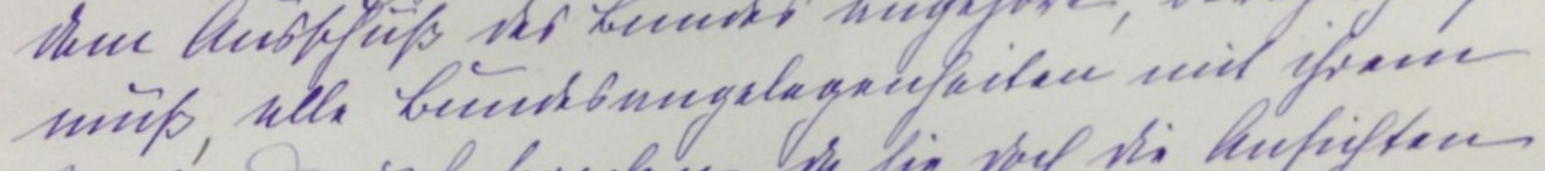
muß, alle Bundesangelegenheiten mit ihrem
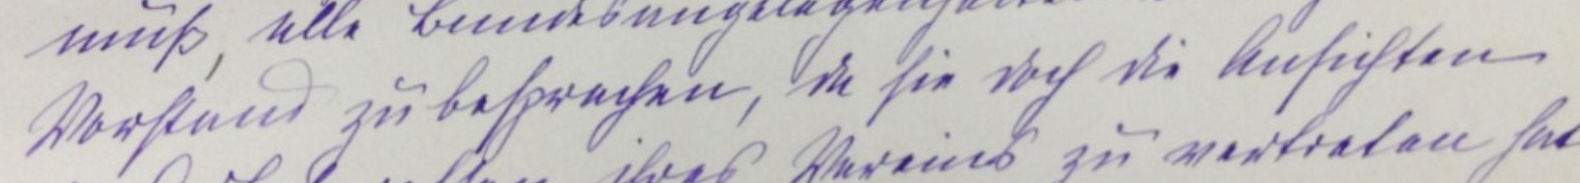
Vorstand zu besprechen, da sie auch die Ansichten
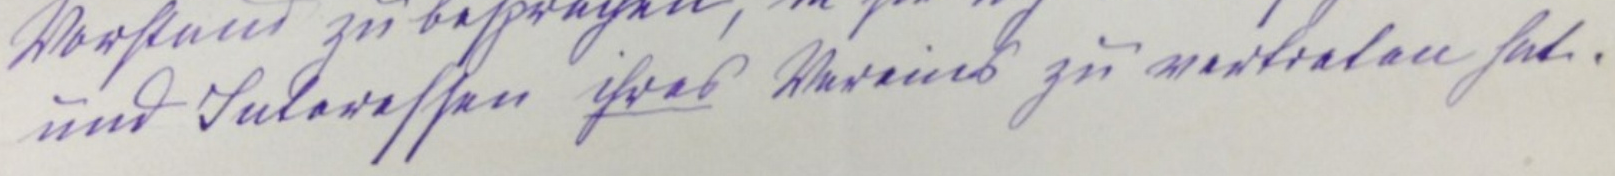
und Interessen Ihres Vereins zu vertreten hat.
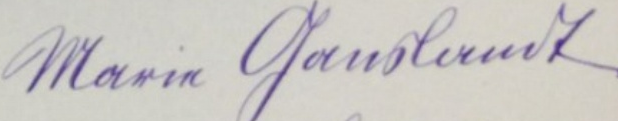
Marie Gansland
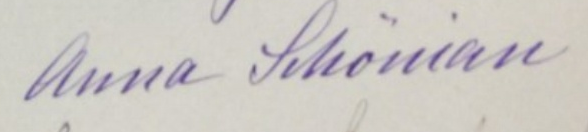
Anna Schönian
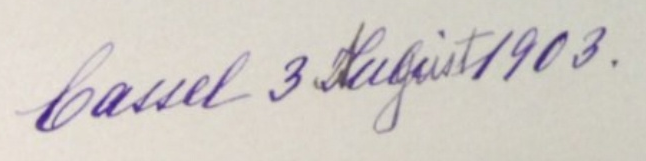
Cassel, 3. August 1903
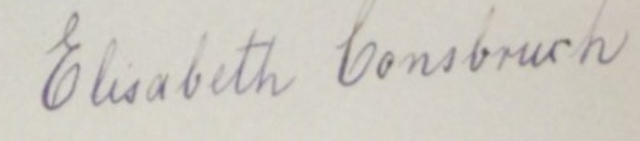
Elisabeth Consbruch
